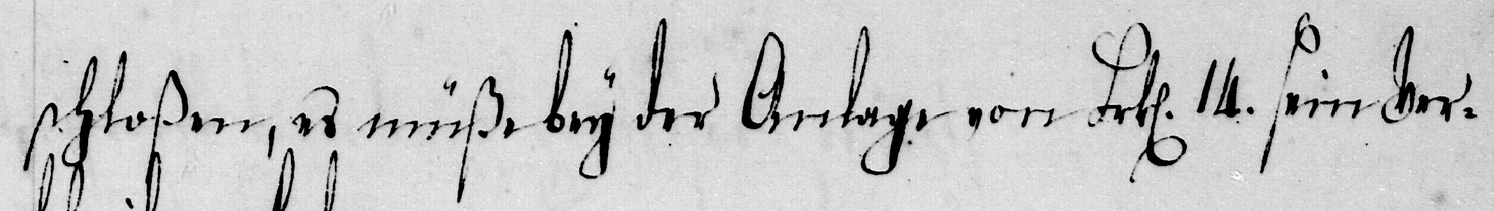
schloßen, es müße bey der Anlage von Frk[en]. 14. sein
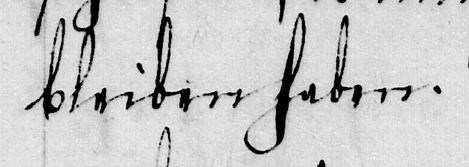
bleiben haben.
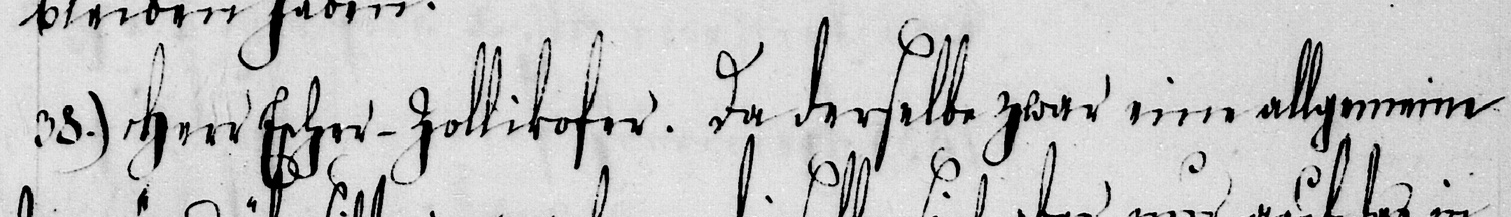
38.) Herr Escher-Zollikhofer. Da derselbe zwar eine allgemeine
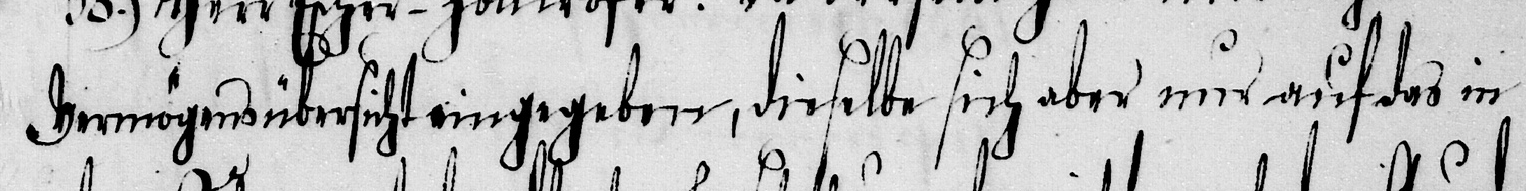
Vermögensübersicht eingegeben, dieselbe sich aber nur auf das in
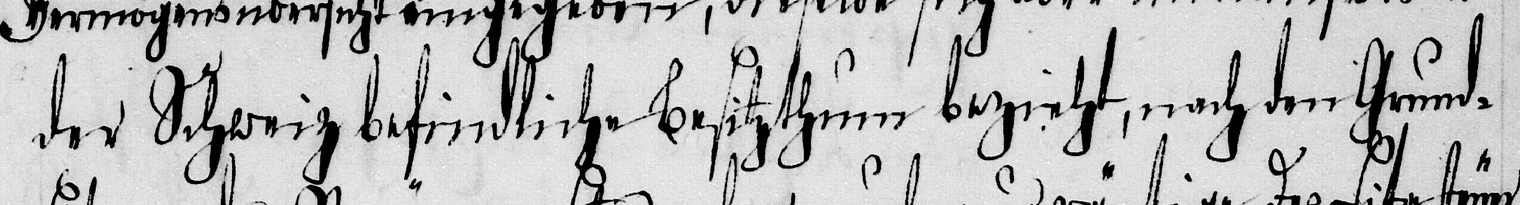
der Schweiz befindliche Besitzthum bezieht, nach den Grund¬
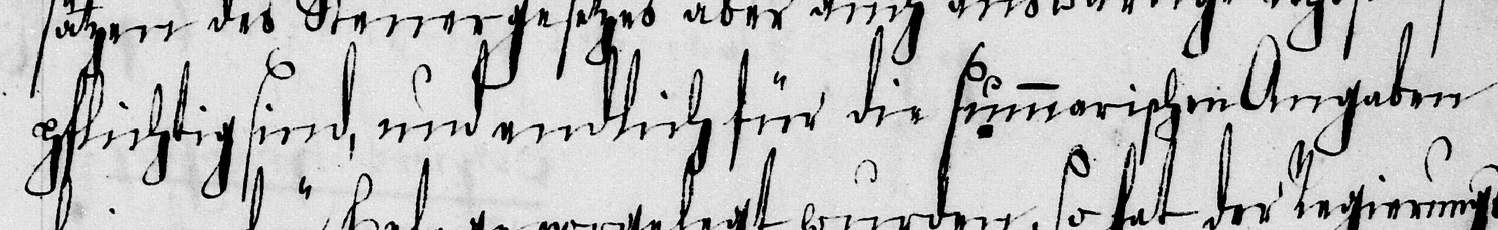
pflichtig sind, und endlich für die summarischen Angaben
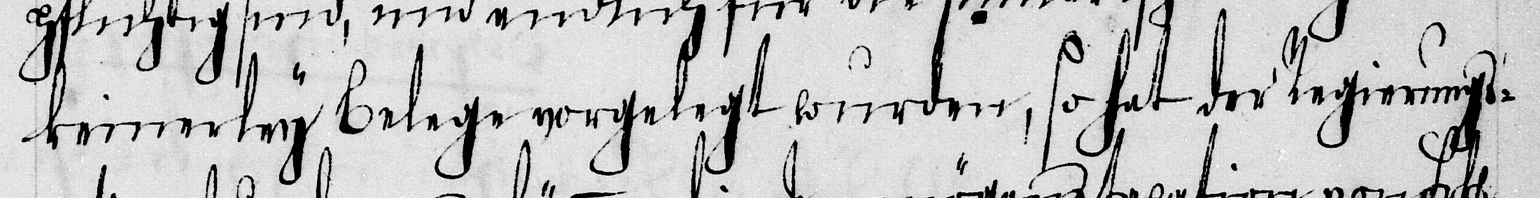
keinerley Belege vorgelegt wurden, so hat der Regierungs¬
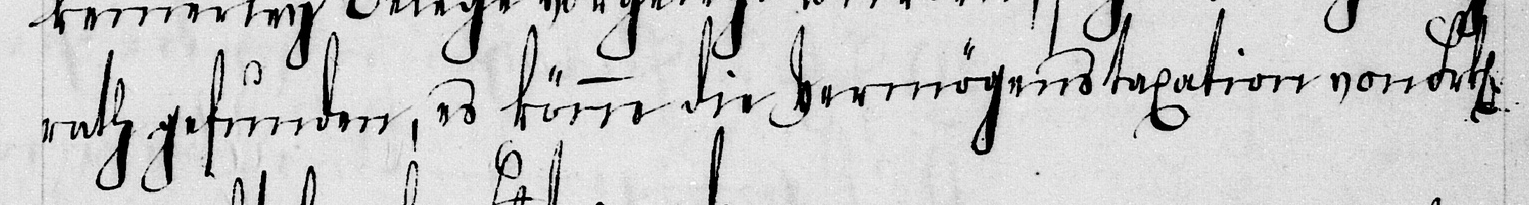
rath gefunden, es könne die Vermögenstaxation von Frk[e¬
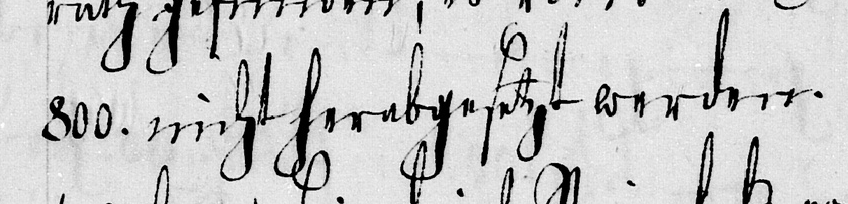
800. nicht herabgesetzt werden.
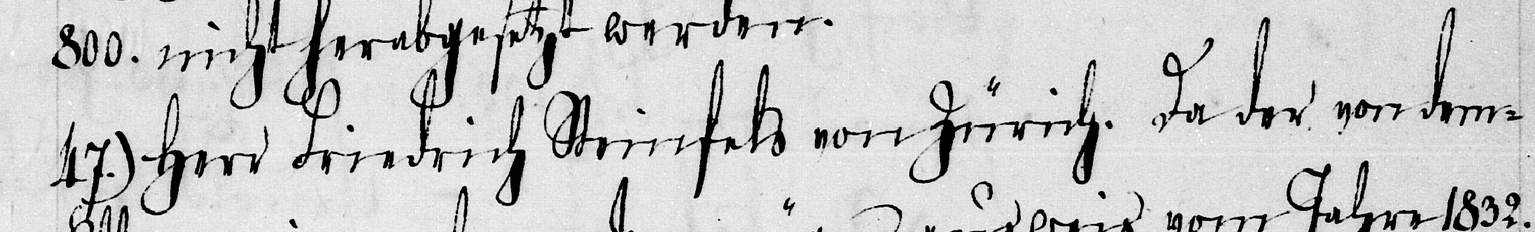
47.) Herr Friedrich Steinfels von Zürich. Da der von dem¬
